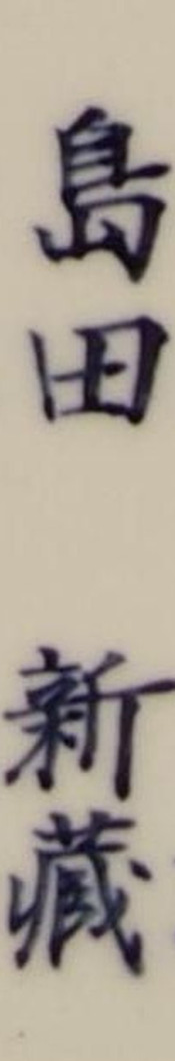島田新蔵
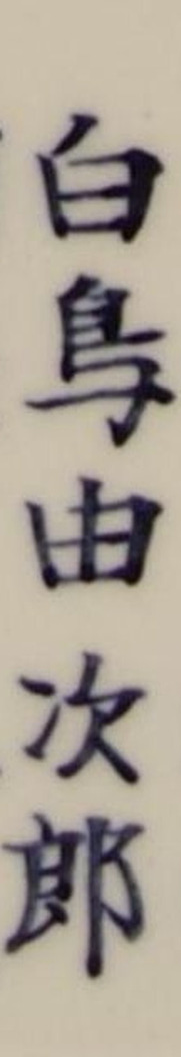白鳥由次郎
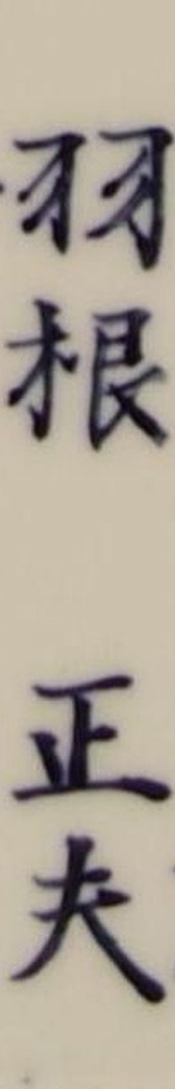羽根正夫
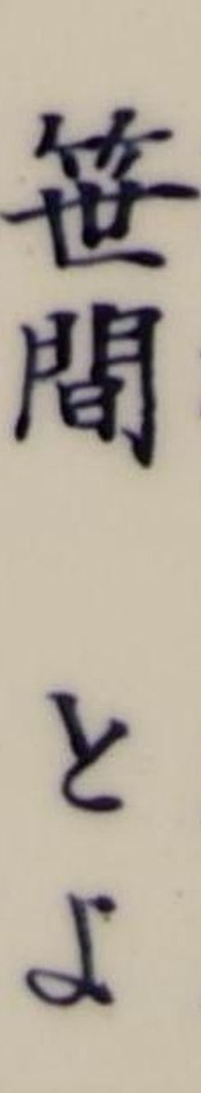笹間とよ
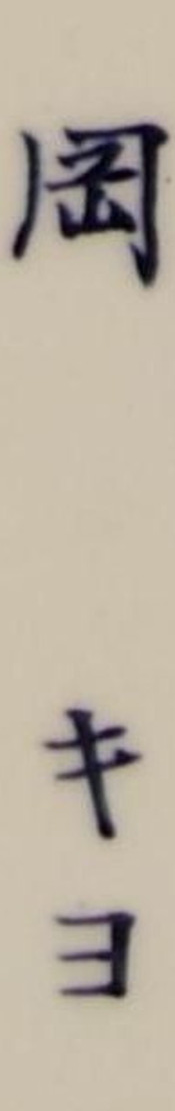岡キヨ
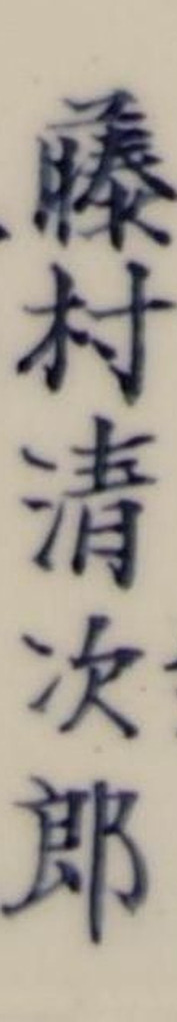藤村清次郎
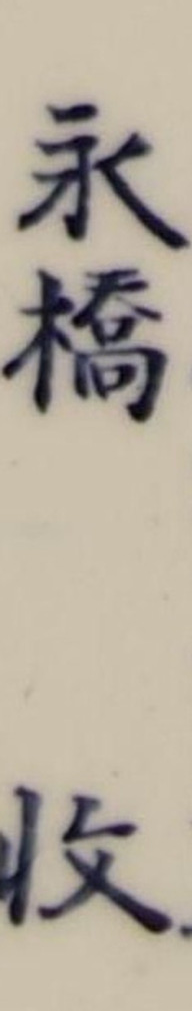永橋收
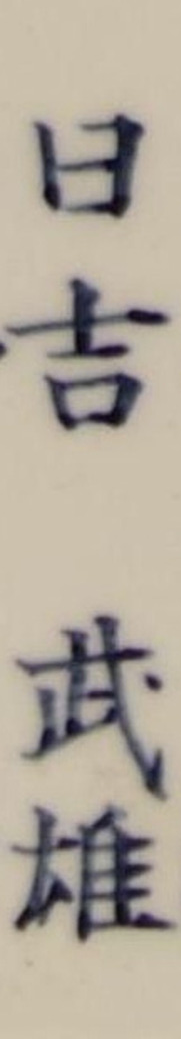日吉武雄
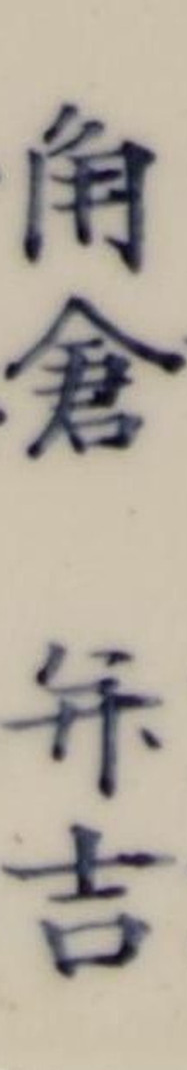角倉弁吉
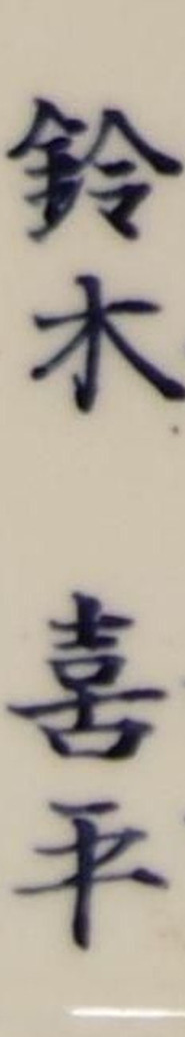鈴木喜平
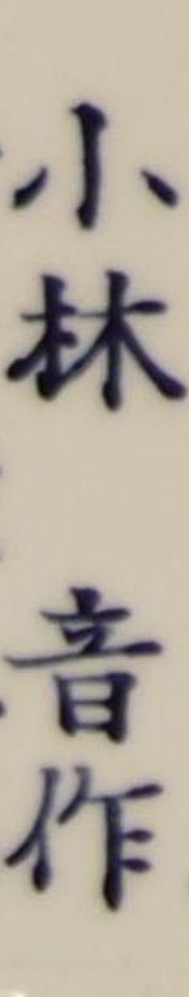小林音作
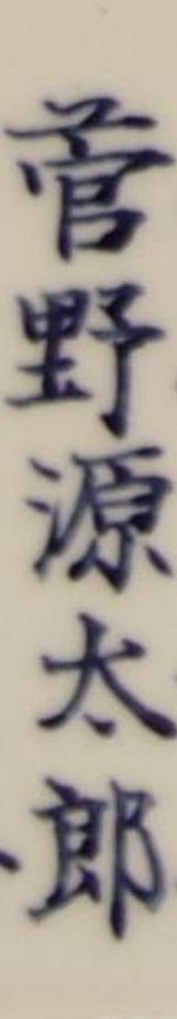菅野源太郎
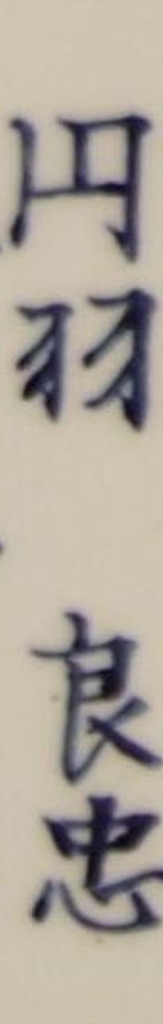円羽良忠
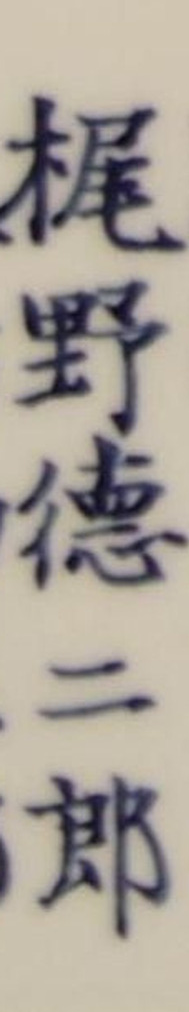梶野徳二郎
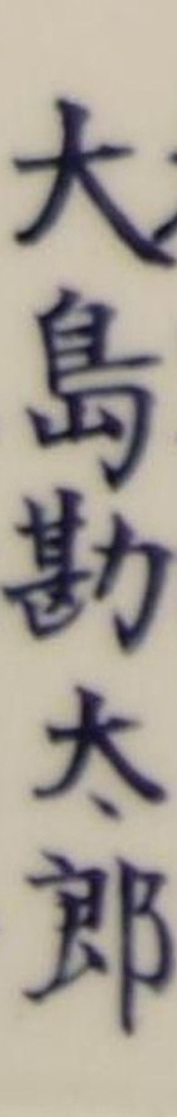大島勘太郎
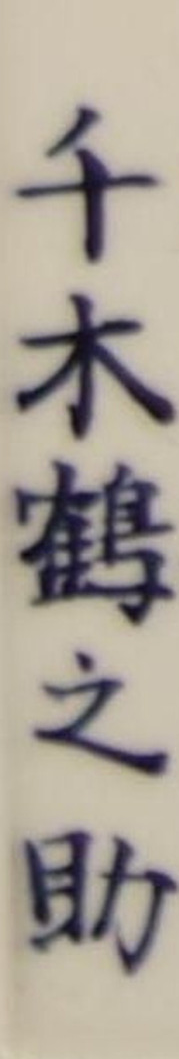千木鶴之助
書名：M~S
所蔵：高野山金剛峯寺
